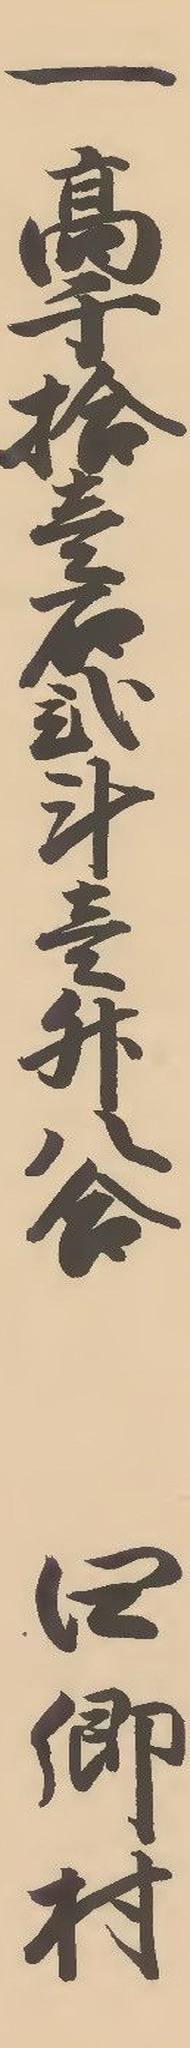一高千拾壱石弐斗壱升八合四郷村
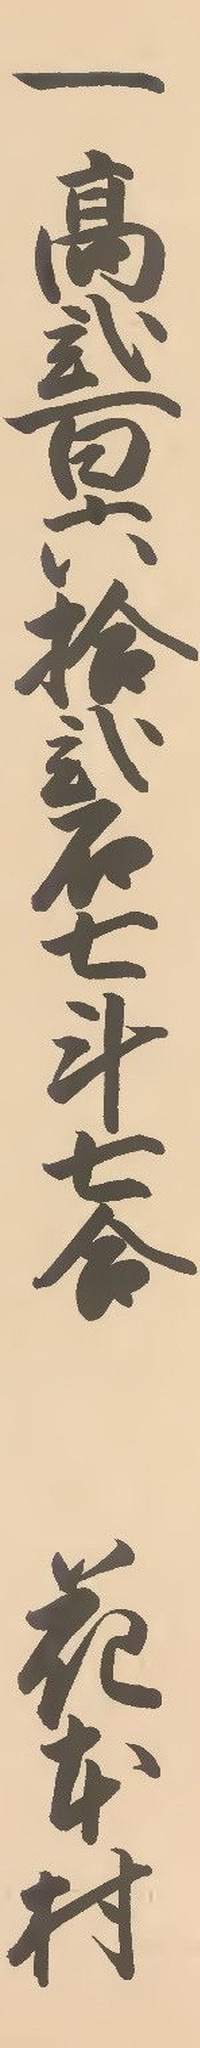一高弐百六拾弐石七斗七合花本村
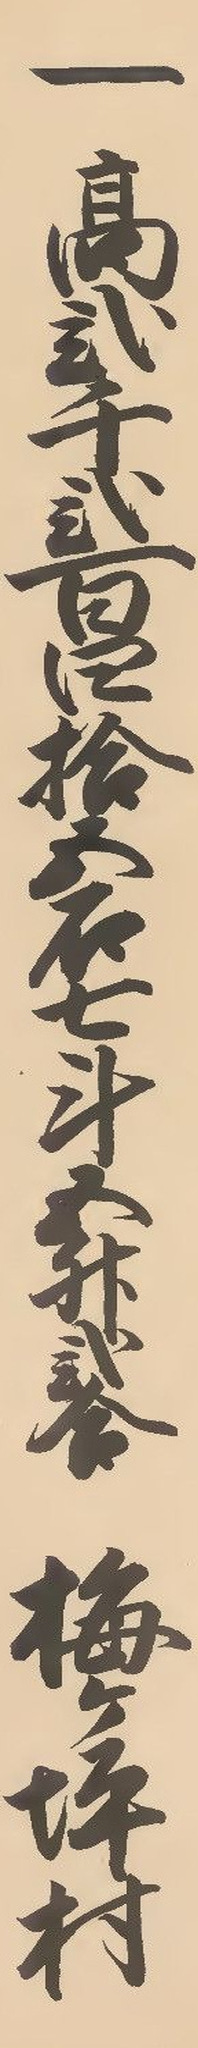一高弐千弐百四拾五石七斗五升弐合梅ヶ坪村
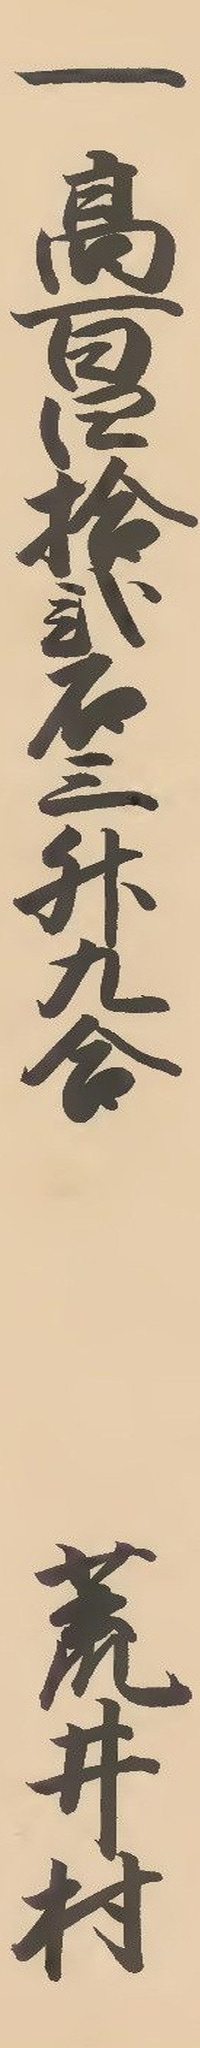一高百四拾弐石三升九合荒井村
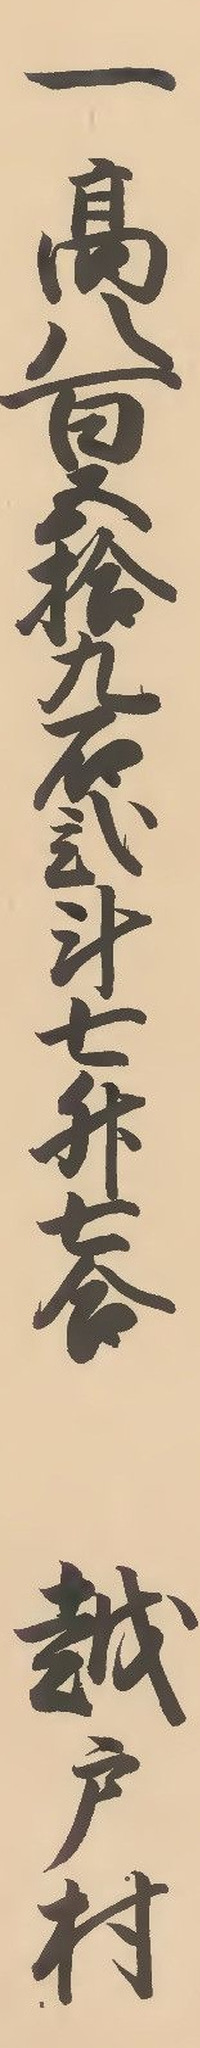一高八百五拾九石弐斗七升七合越戸村

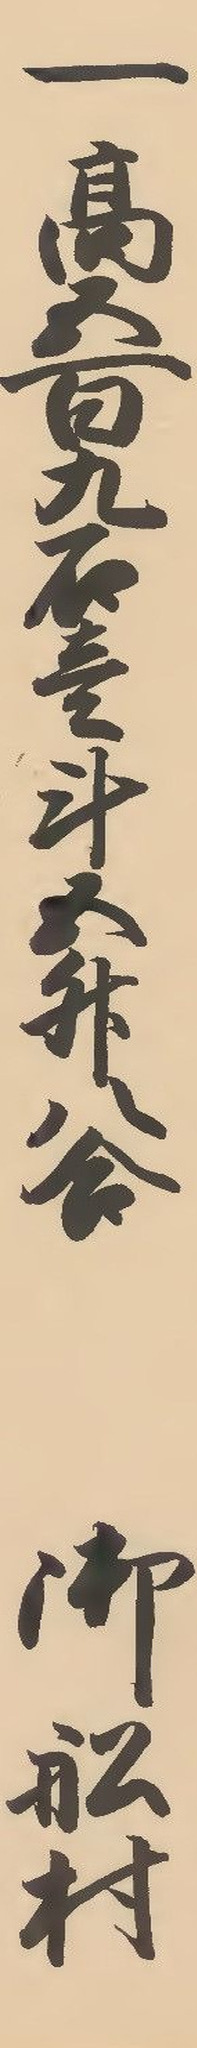一高五百九石壱斗五升八合御船村
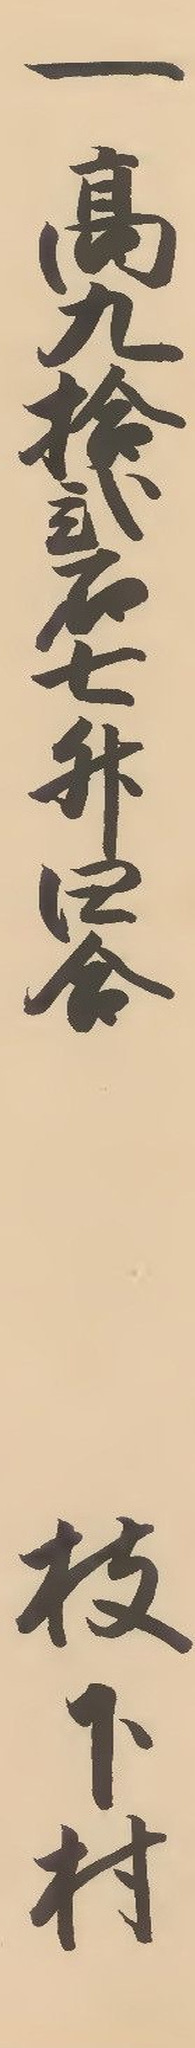一高九拾弐石七升四合枝下村
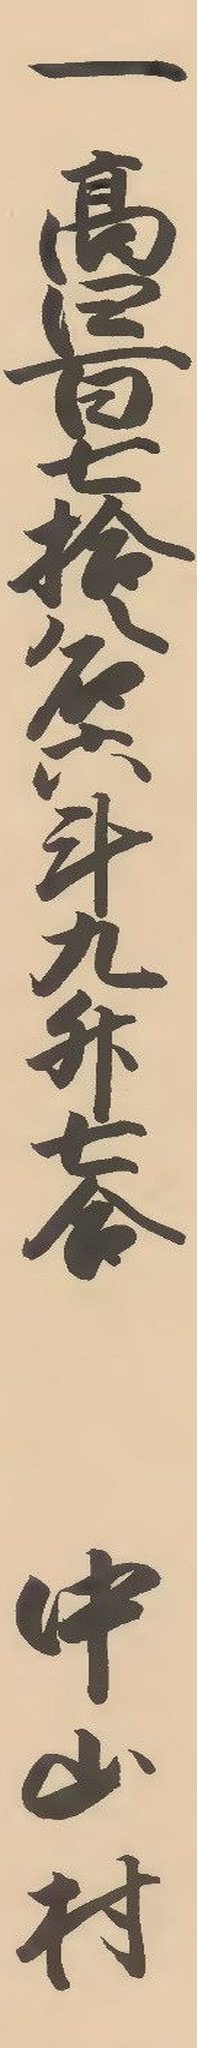一高四百七拾八石六斗九升七合中山村
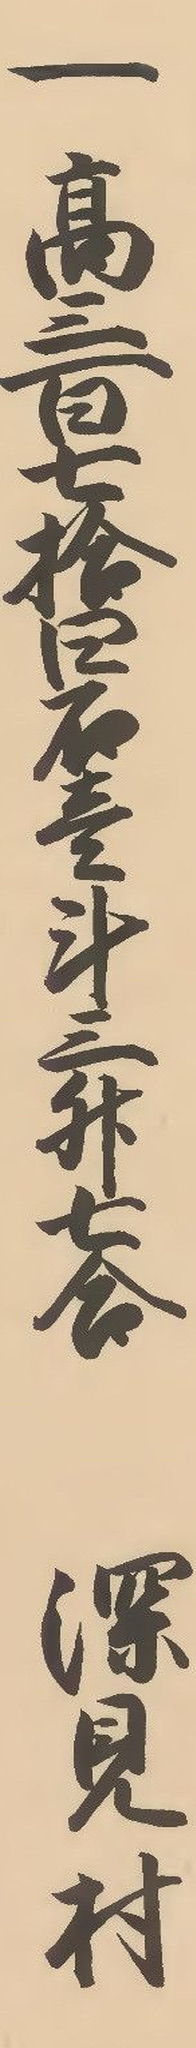一高三百七拾四石壱斗三升七合深見村
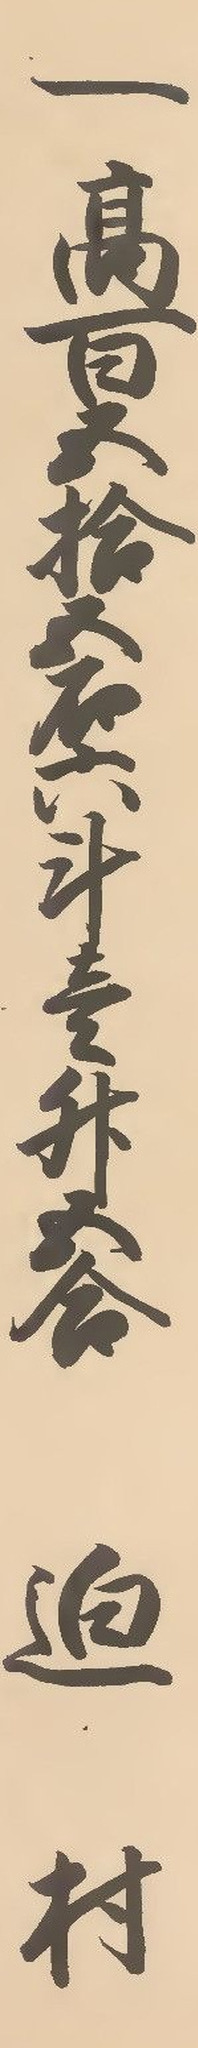一高百五拾五石六斗壱升五合迫村
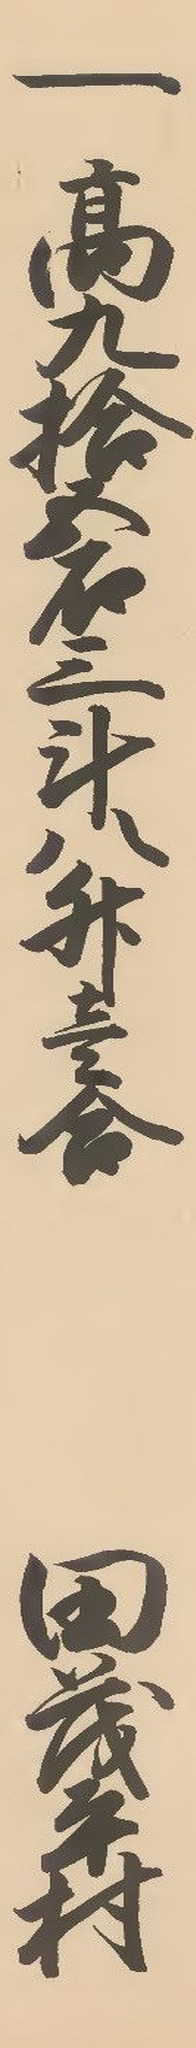一高九拾五石三斗八升壱合田茂平村
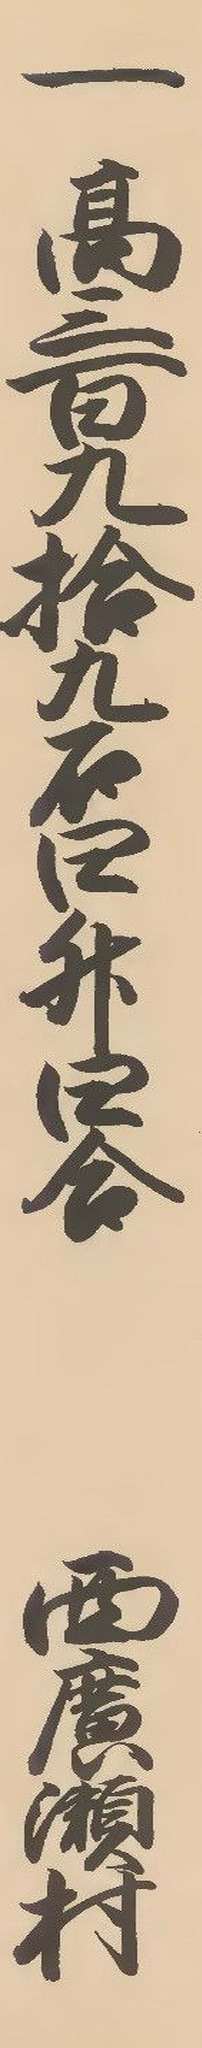一高三百九拾九石四升四合西広瀬村
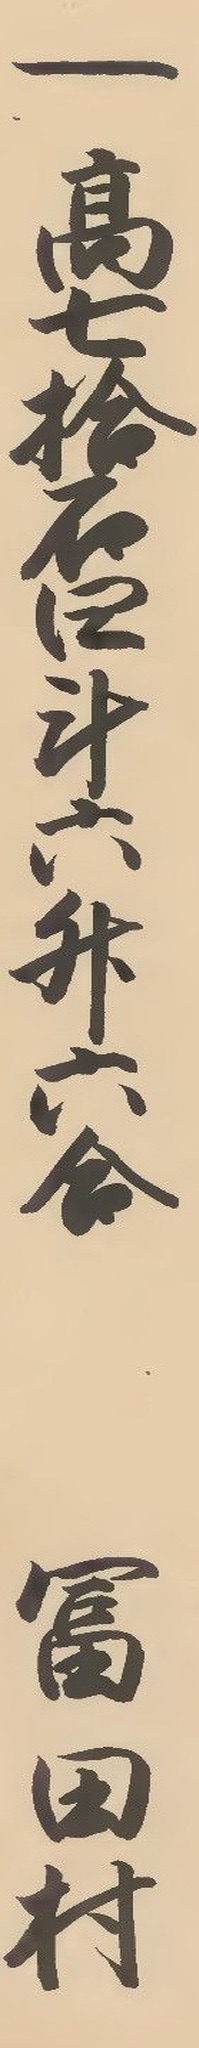一高七拾石四斗六升六合富田村

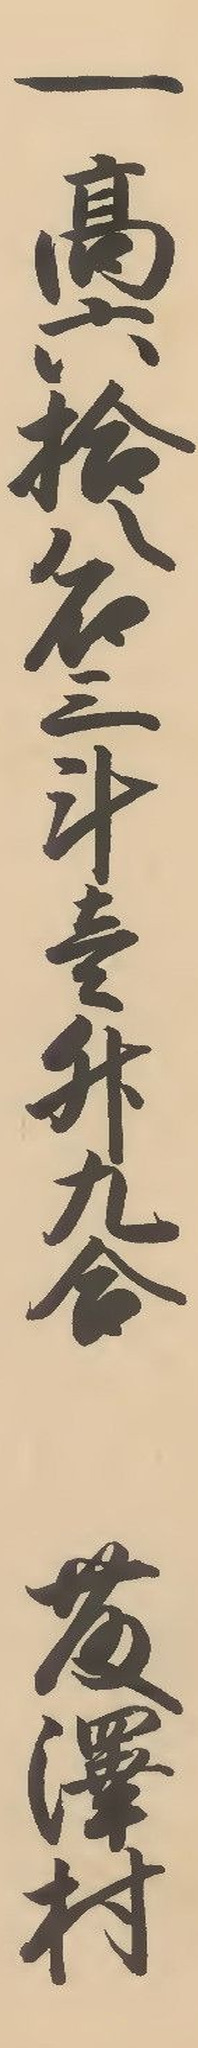一高六拾八石三斗壱升九合藤沢村
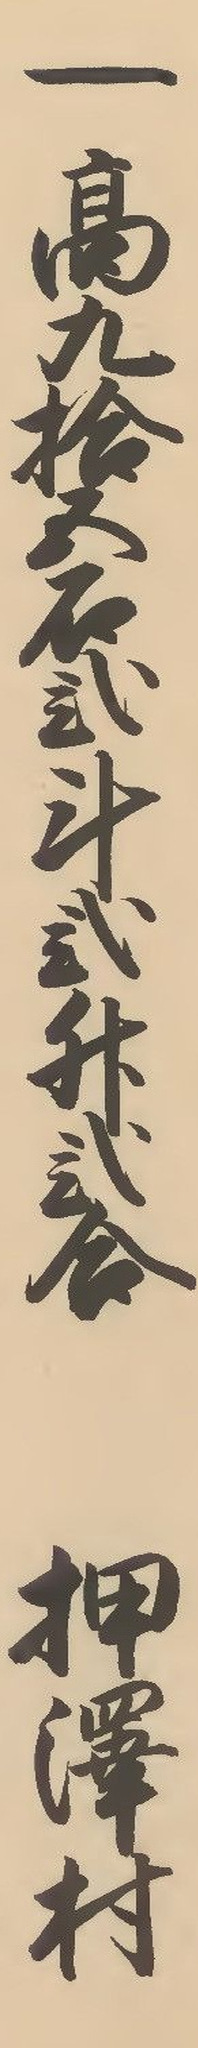一高九拾五石弐斗弐升弐合押沢村
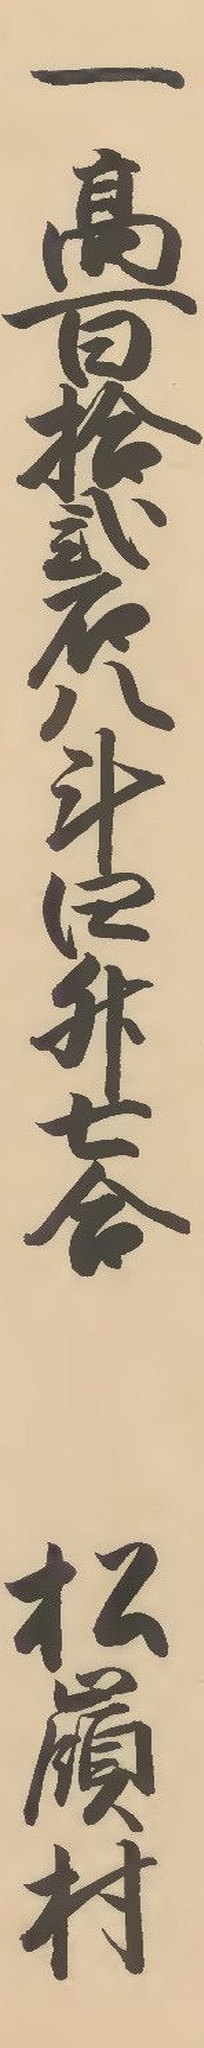一高百拾弐石八斗四升七合松嶺村
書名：三河国郷帳
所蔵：国立公文書館 National Archives of Japan
